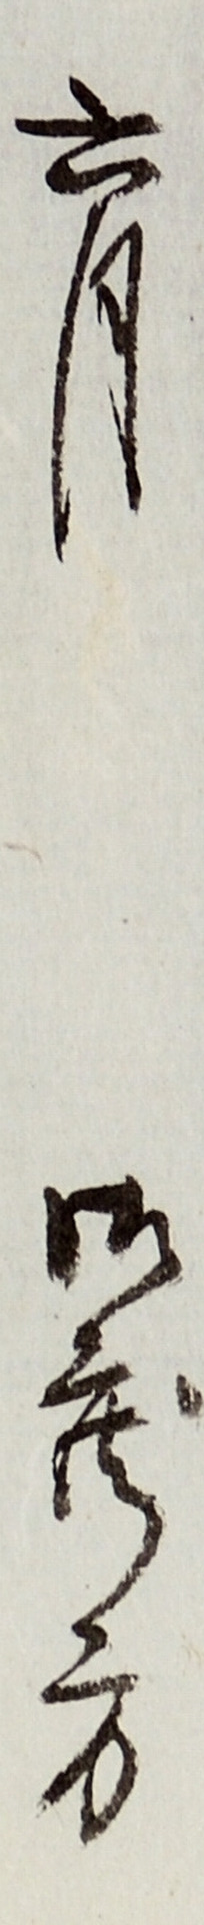六月御蔵方
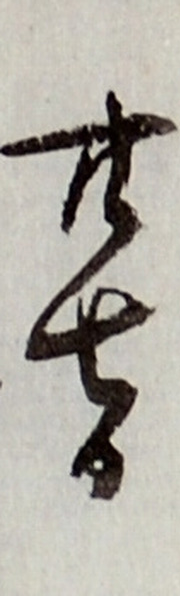廿七日
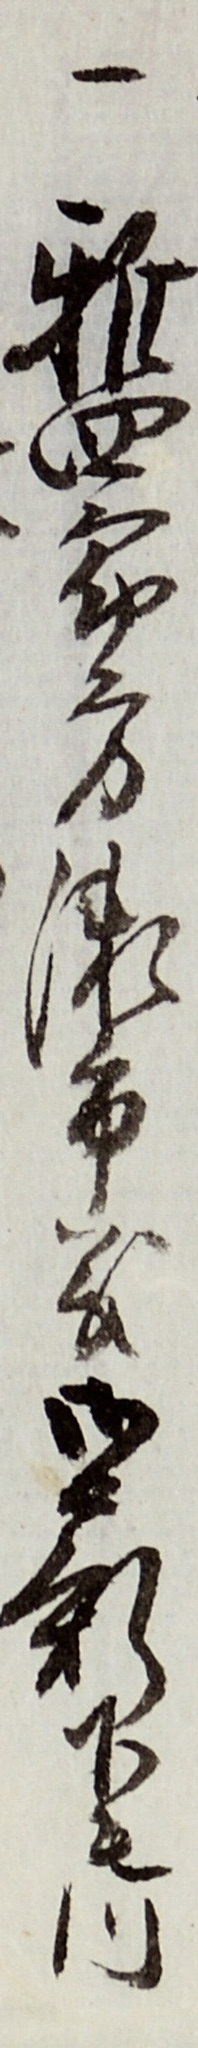一雅四郎方瀬市義御薪下モ川
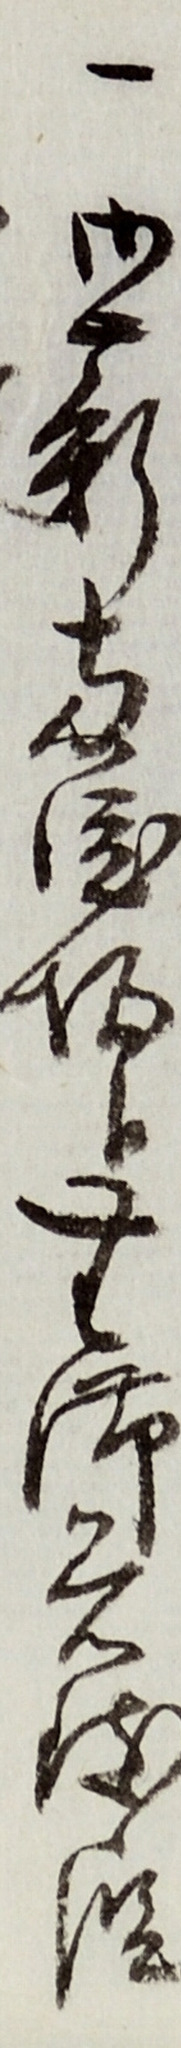一御薪両渡場江無滞着致候段
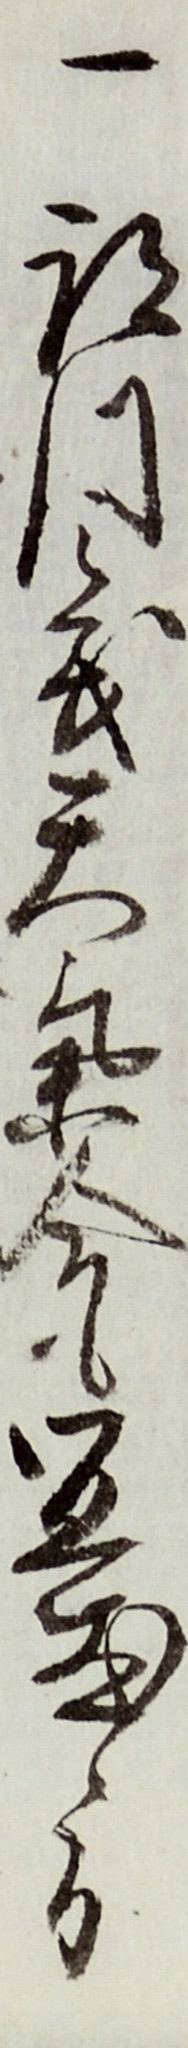一跡川義天気合も宜敷候間
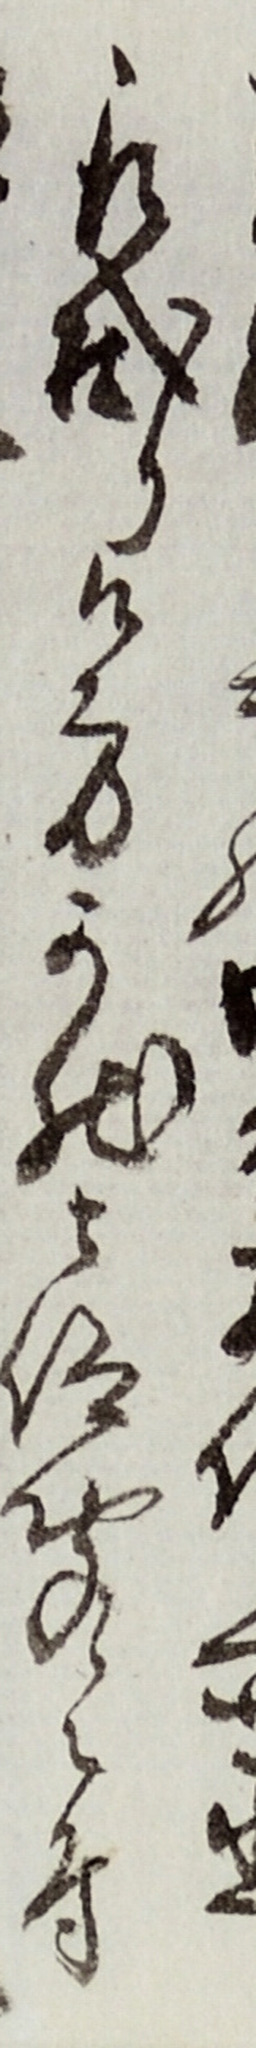取掛り候方可然被仰聞候ニ付
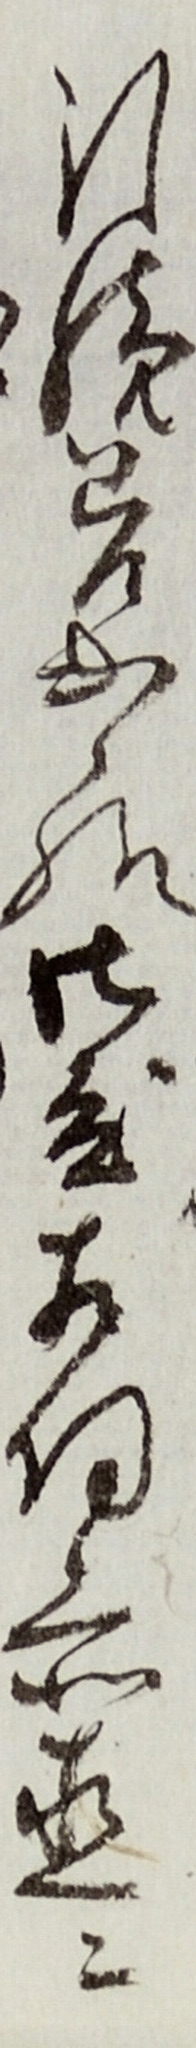引続差出候様此度相伺候所直ニ
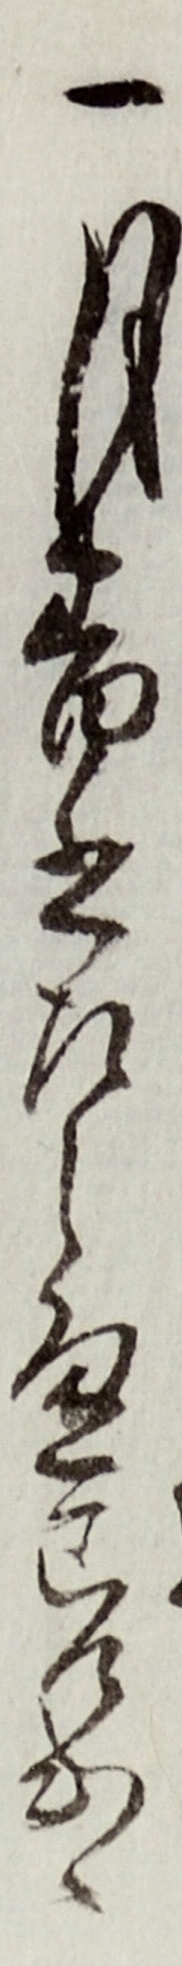一月番書左之通差出候
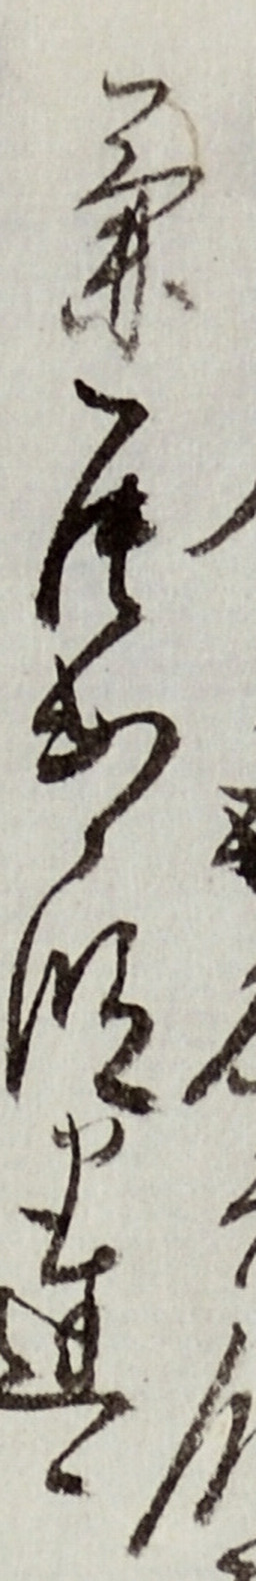兼罷出候段申達候
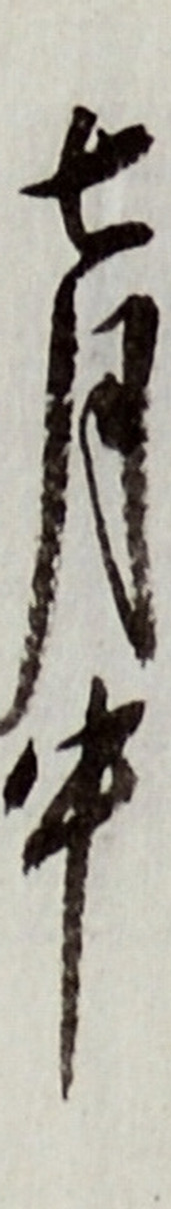七月中
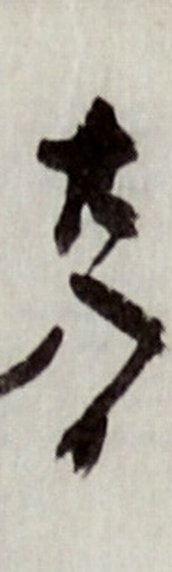廿八日
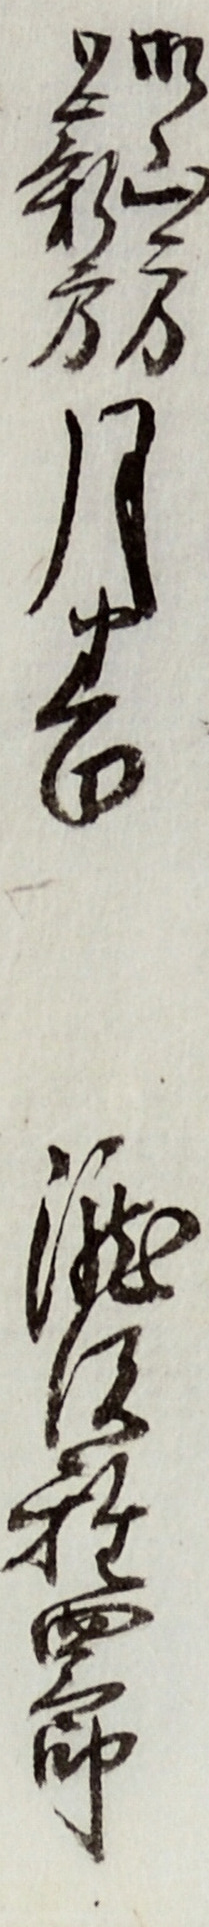御薪方月番瀧沢雅四郎
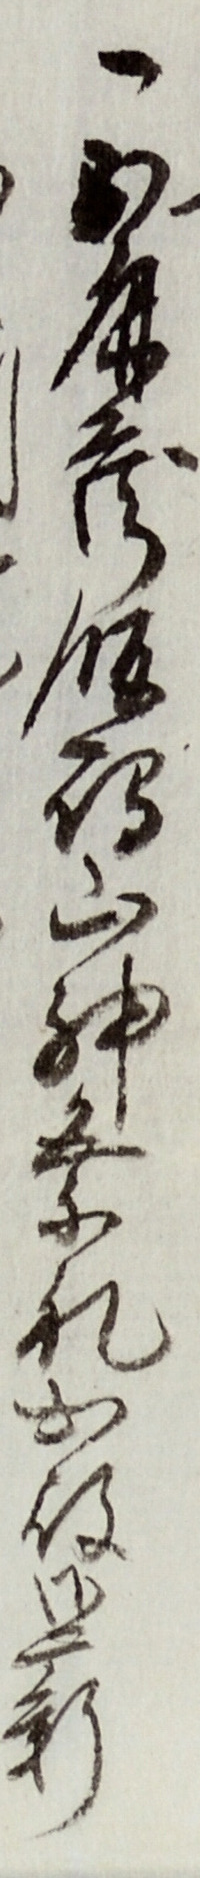一麗蔵飯嶋山神祭礼出役御薪
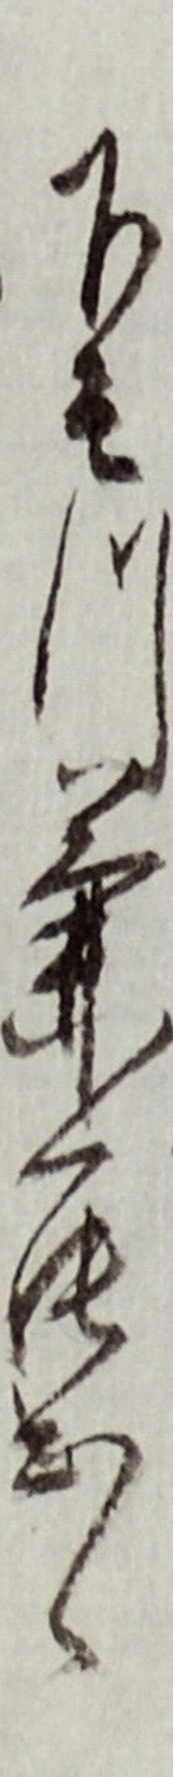下モ川兼罷出候
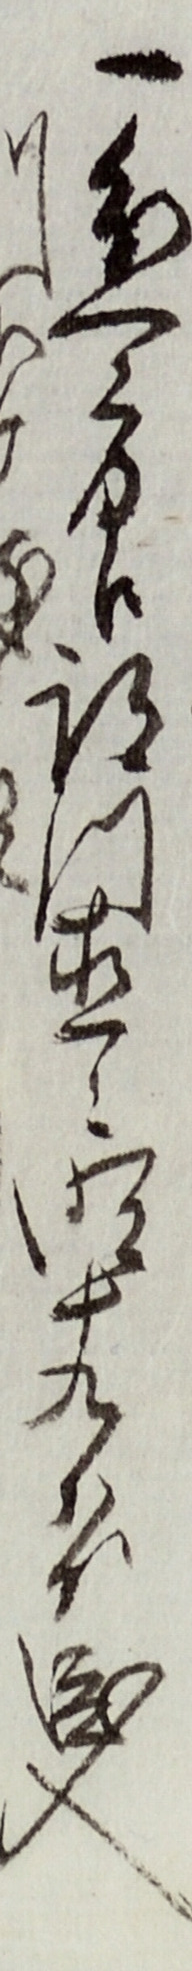一分一方江跡川直ニ明十九日ゟ？渡入
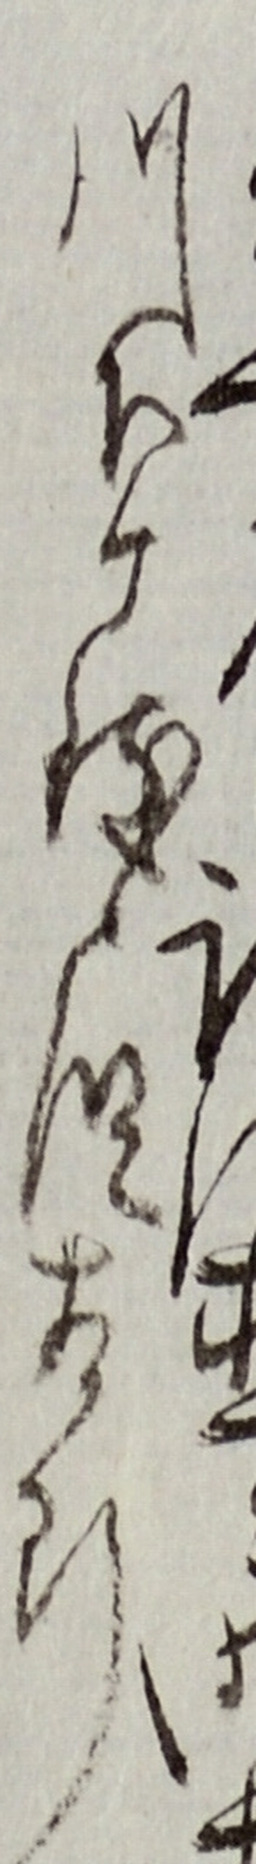川下ケ致候段相断
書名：御山方御薪方諸事御用留
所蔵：伊那市立高遠町図書館・合同会社AMANE
